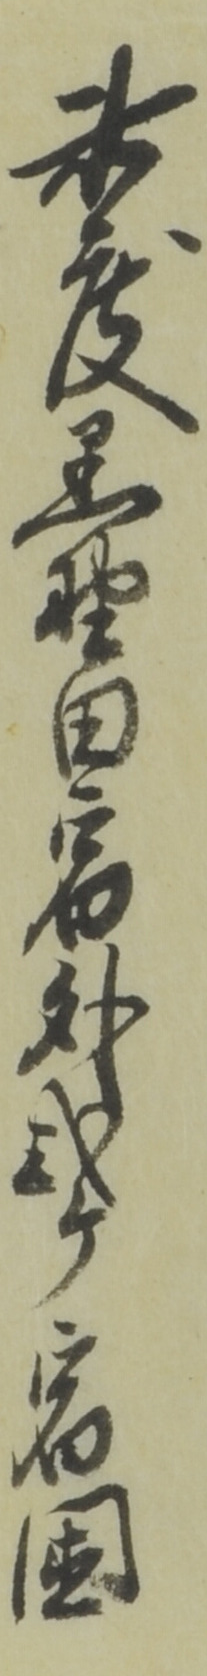此度黒野田宿外弐ヶ宿困
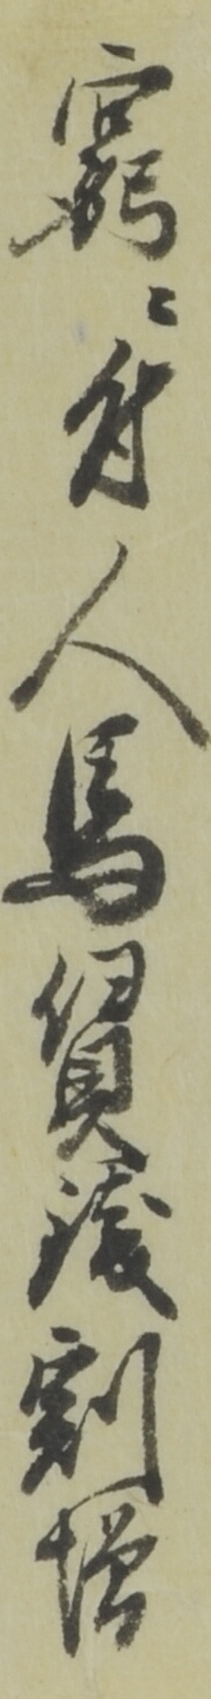窮ニ付人馬賃銭割増
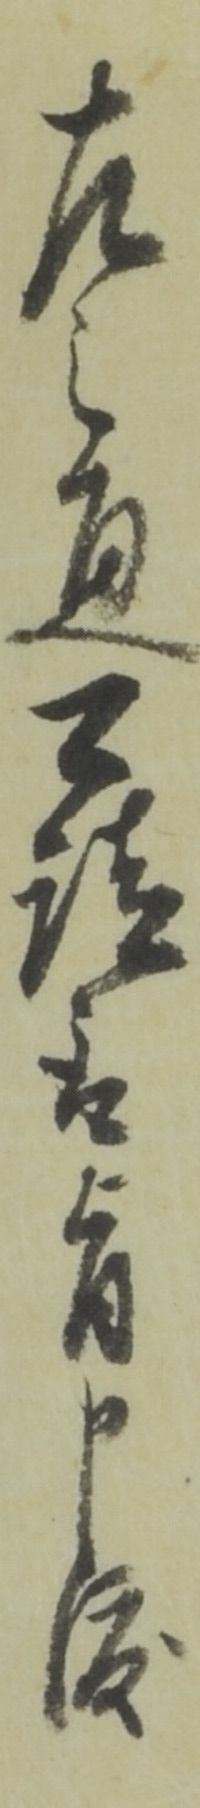左之通可請取旨申渡
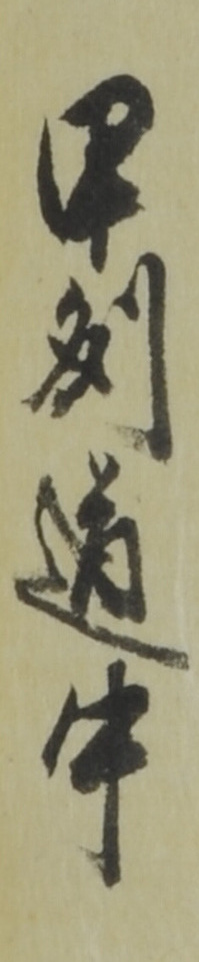甲州道中
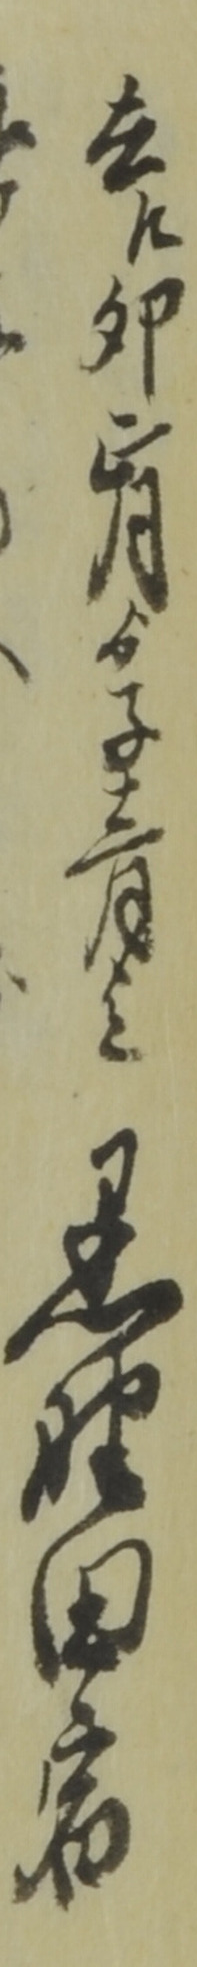去ル卯正月ゟ子十二月迄黒野田宿
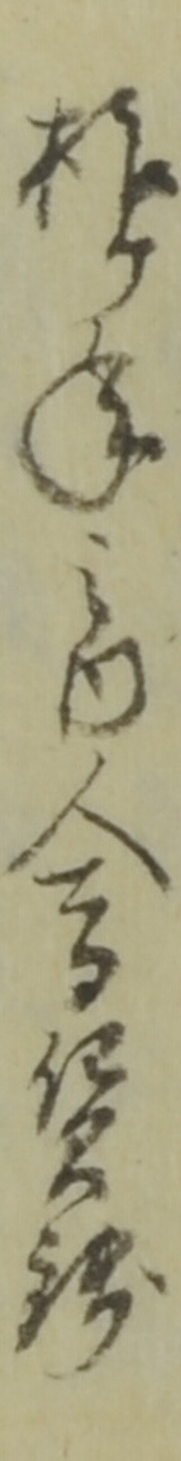拾ヶ年之内人馬賃銭
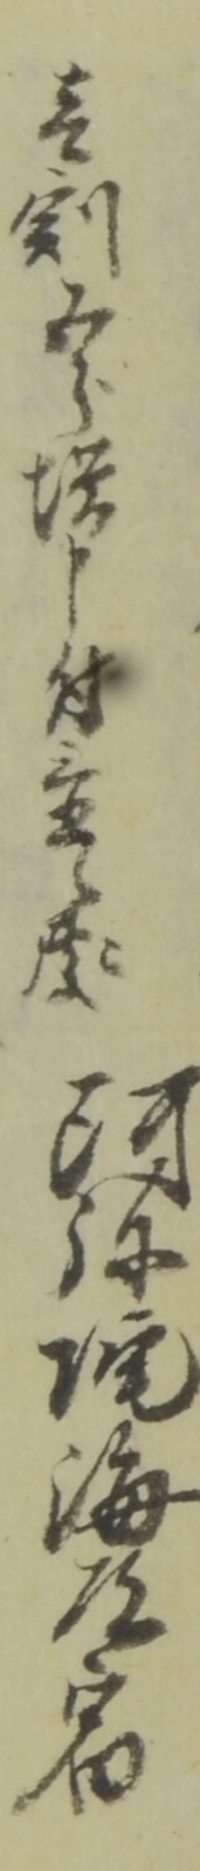壱割五分増申付置候処ニ阿弥陀海道宿
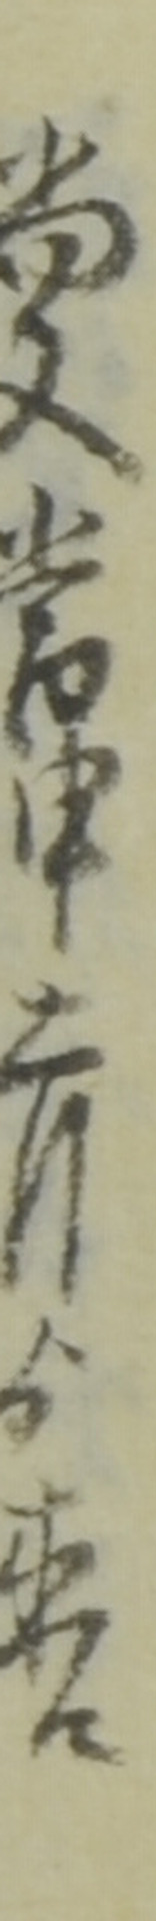尚又常申十一月ゟ来候

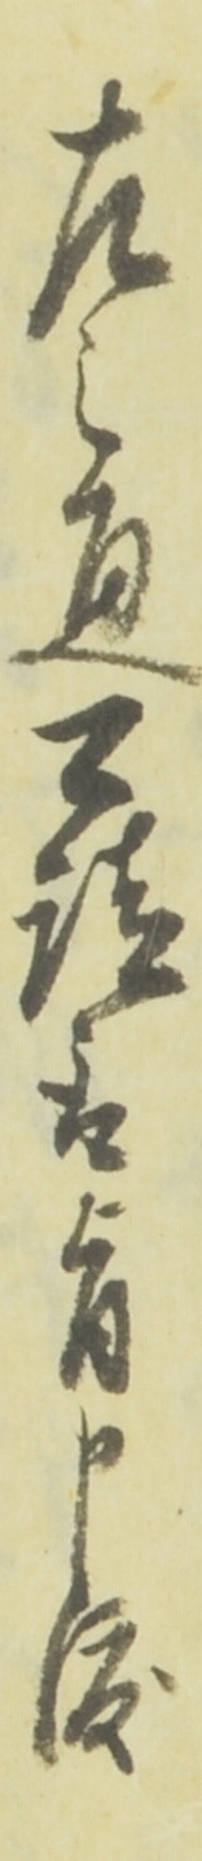左之通可請取旨申渡
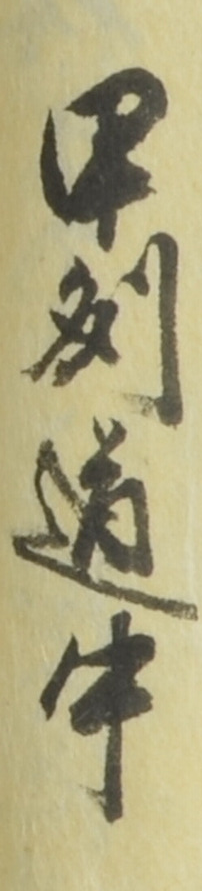甲州道中
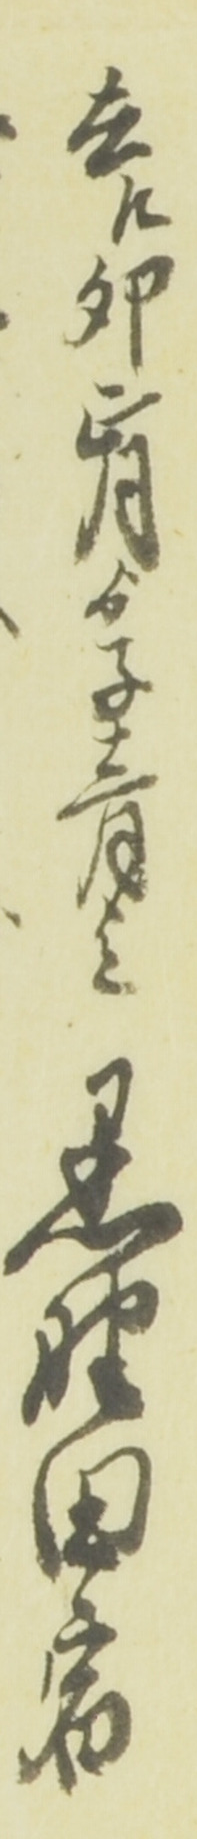去ル卯正月ゟ子十二月迄黒野田宿
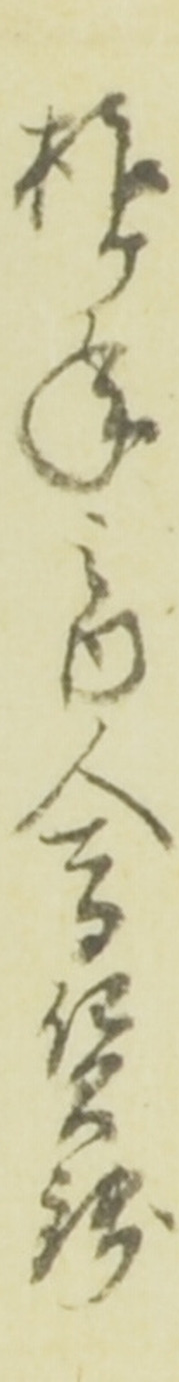拾ヶ年之内人馬賃銭
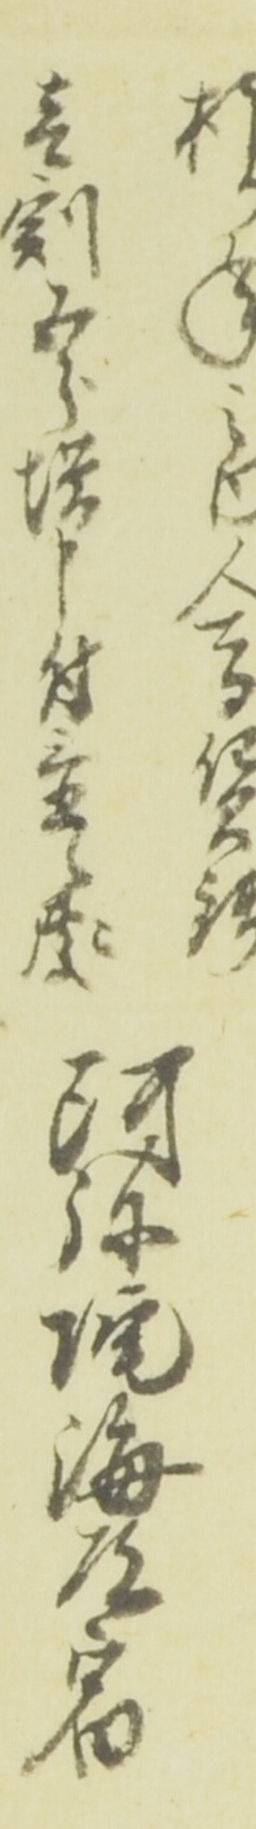壱割五分増申付置候処阿弥陀海道宿
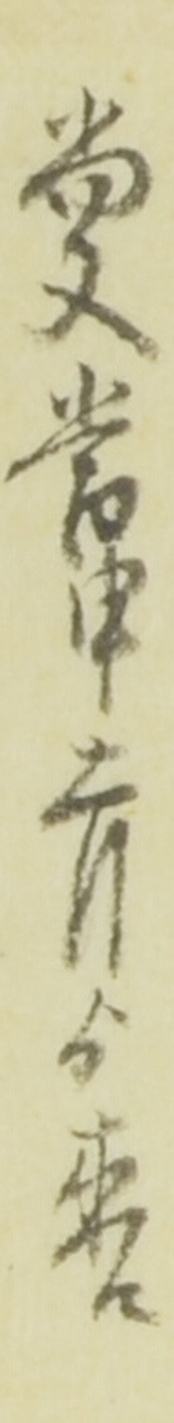尚又当申十一月ゟ来ル
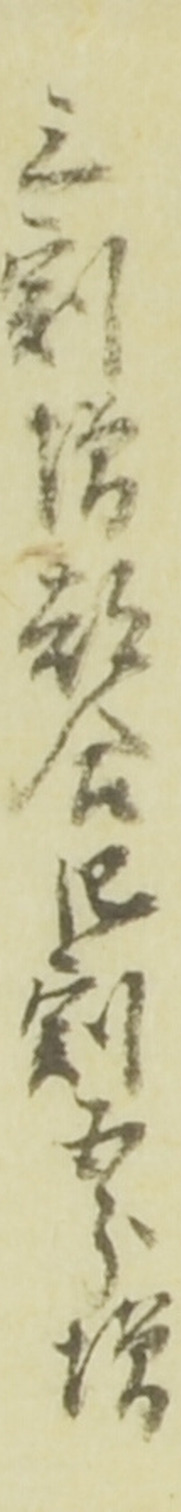三割増都合四割五分増
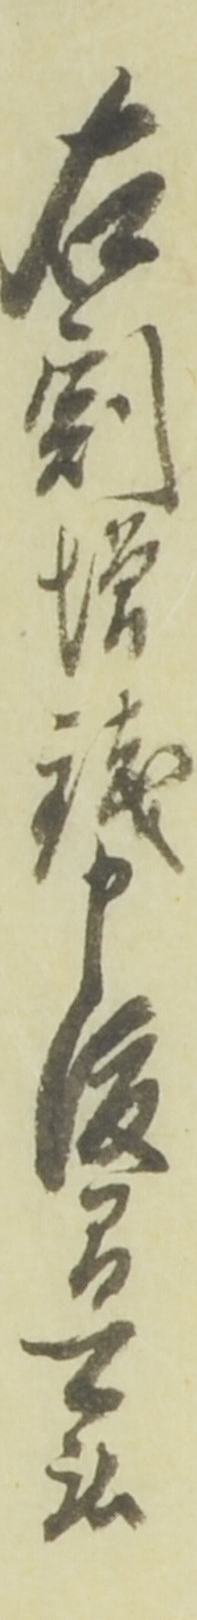右割増銭申渡間可被
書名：御触書御書附控
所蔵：伊那市立高遠町図書館・合同会社AMANE
